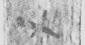五
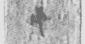十
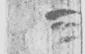三
